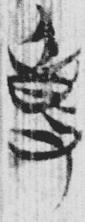事
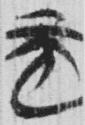而
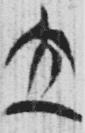立
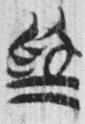爲
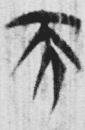天
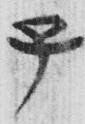子
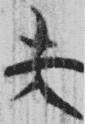○（堯）
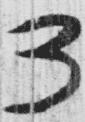乃
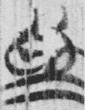爲
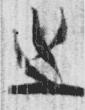之
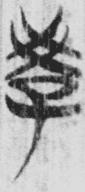○（教）
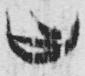曰
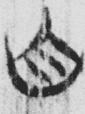自
